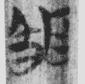䎽（聞）
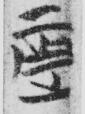○（崇）
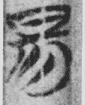昜（揚）
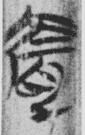{产色}（顏）
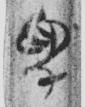色
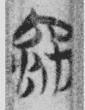深
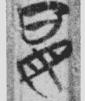晦
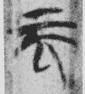而
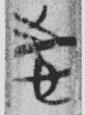志
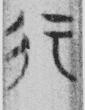行
